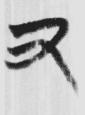又
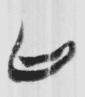㠯（以）
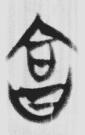合
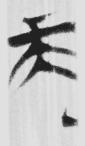天
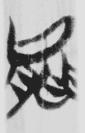能
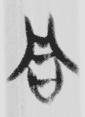同
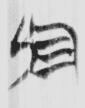於
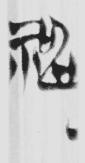神
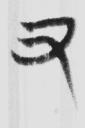又
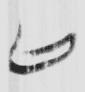㠯（以）
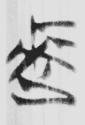麥
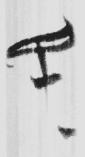民
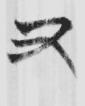又
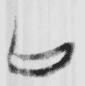㠯（以）
